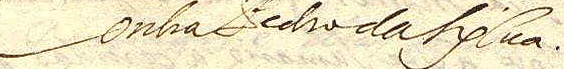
Contra Pedro da Sylua
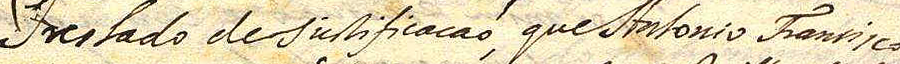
Treslado de justificacaõ, que Antonio Francisco
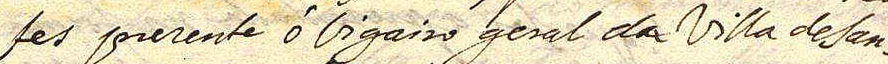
fes prezente ó vigairo geral da Villa de San
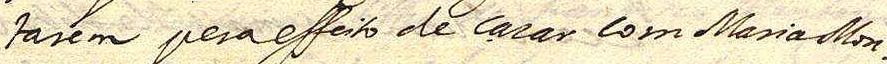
tarem pera effeito de cazar com Maria Mon
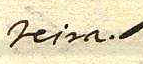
teira.
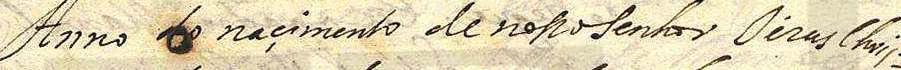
Anno do naçimento de nosso senhor Jesus Chris
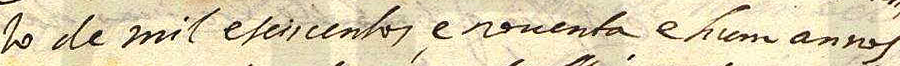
to de mil e seiscentos, e nouenta, e hum annos,
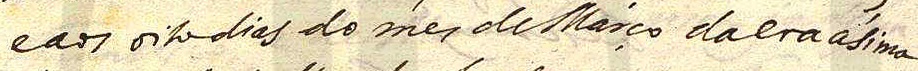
e aos oito dias do mes de Março da era asima
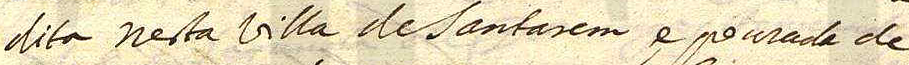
dita nesta villa de Santarem e pouzada de
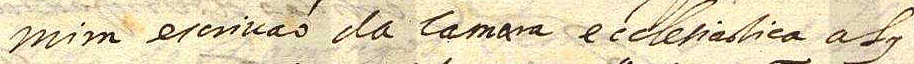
mim escriuaõ da Camara ecclesiastica aLy
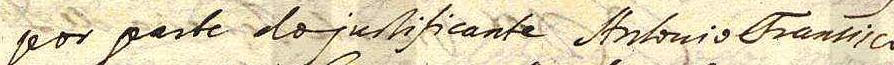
por parte do justificante Antonio Francisco
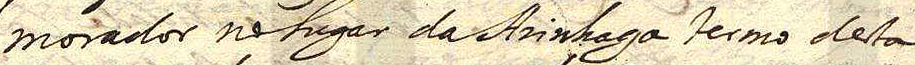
morador no lugar da Azinhaga termo desta
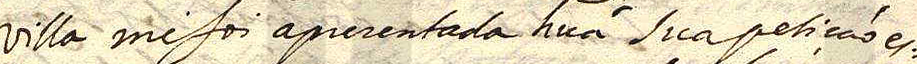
villa me foi aprezentada huā sua petiçaõ es
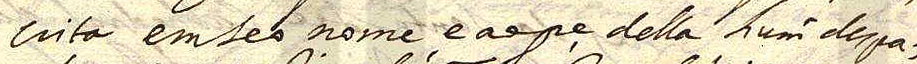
crita em seo nome, e ao pe della hum̄ despa
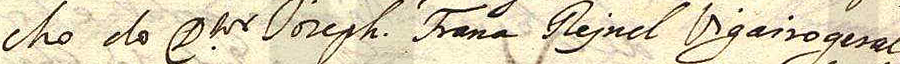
cho do D.tor Jozeph Trana Rejnel Vigairo geral,
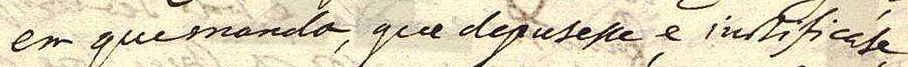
em que manda, que depusesse, e iustificase,
